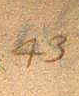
43
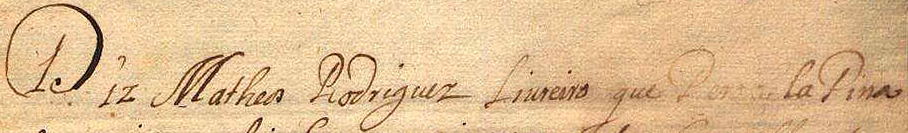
Diz Matheos Rodriguez Liureiro que Pedro laPina
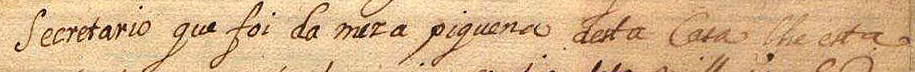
Secretario que foi da meza piquena desta Casa lhe esta
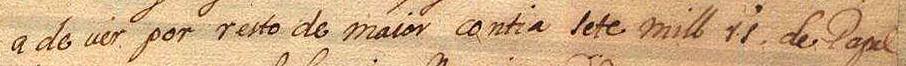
a deuer por resto de maior contia sete mill rs̄ de Papel
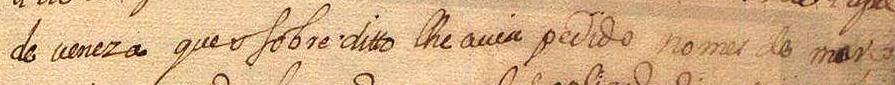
de ueneza que o sobreditto lhe auia pedido no mes de março
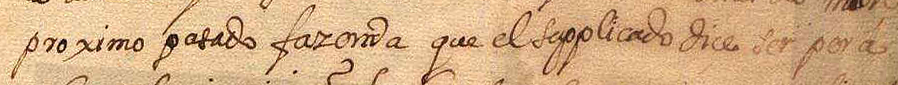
proximo pasado fazenda que el supplicado dice ser pera
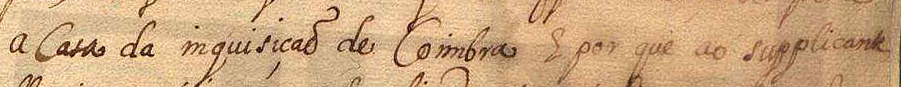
a Casa da inquisiçaõ de Coimbra E porque ao supplicante
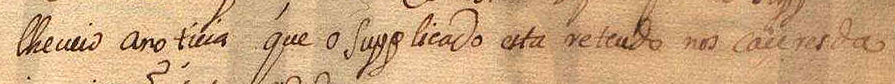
lhe ueio a noticia que o supplicado esta reteudo nos caceres da
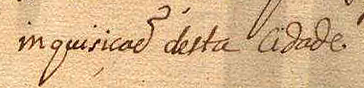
inquisiçaõ desta cidade
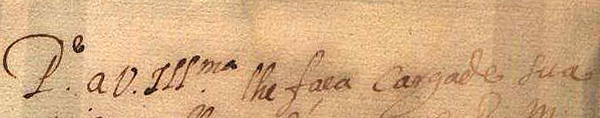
P.e a V. Ill.ma lhe faça carga de sua
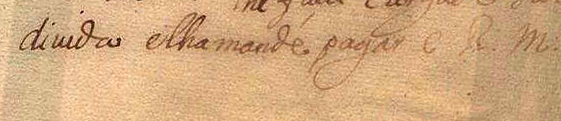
diuida e lha mande pagar e R. m.
